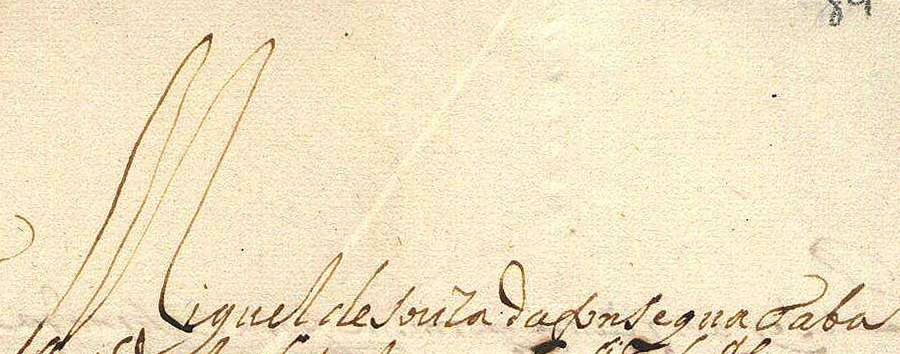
Miguel de Souza da fonsequa Taba
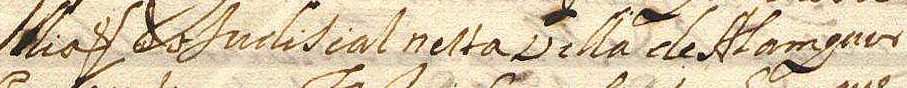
liaõ do Judisial nesta Villa de Alamquer
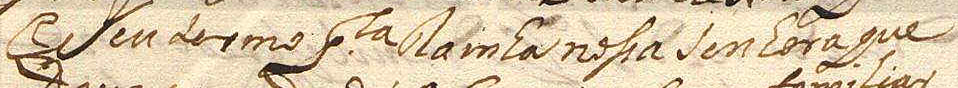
e Seu termo p.la Rainha nossa senhora que
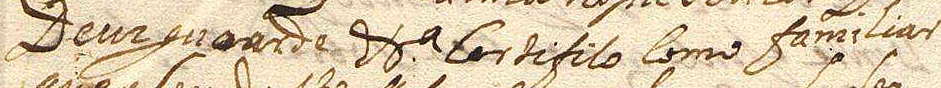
Deus guarde &.a Certifico como familiar
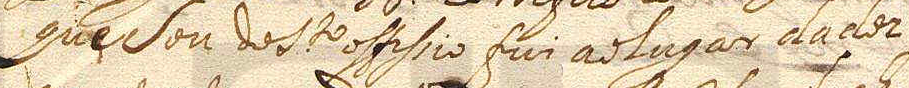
que Sou do s.to offissio fui ao Lugar da dos
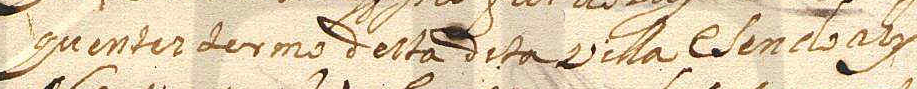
quentes termo desta dita villa, e sendo ahy
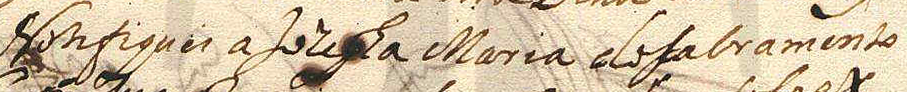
Notifiquei a Jozepha Maria do sacramento
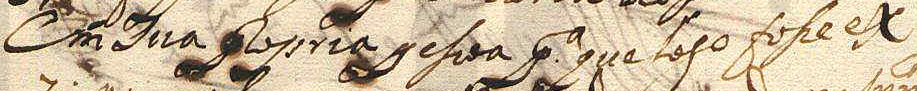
Em sua pRopria pessoa p.a que logo fosse eX
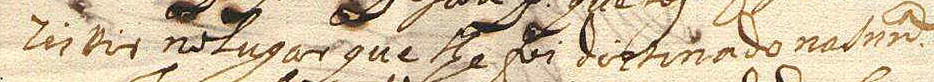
Zistir no Lugar que lhe foi distinado na snn.ça
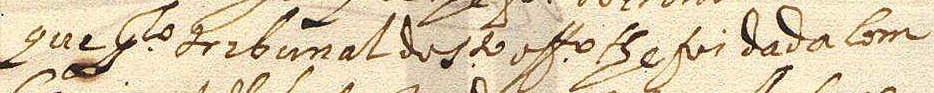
que p.lo tribunal do s.to off.o lhe foi dada Com
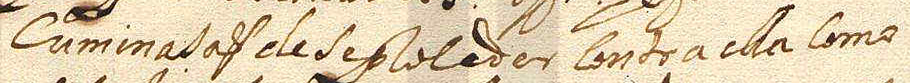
Cuminasaõ de se pRoceder contra ella Como
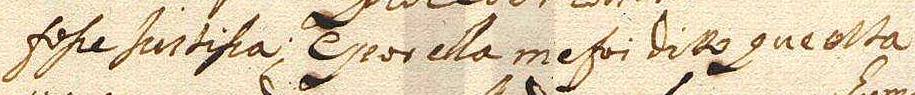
fosse Justissa; e por ella me foi ditto que esta
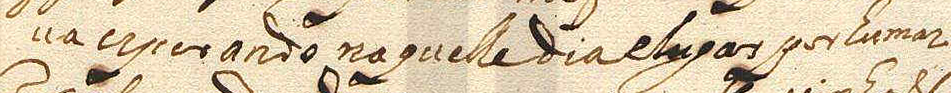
ua esperando naquelle dia e lugar por humas
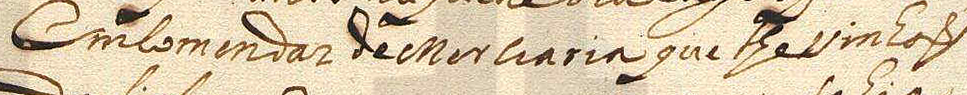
Emcomendaz de Merciaria que lhe vinhaõ
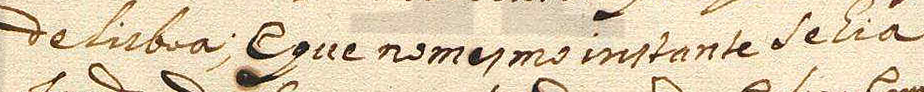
de lisboa; E que no mesmo instante se hia
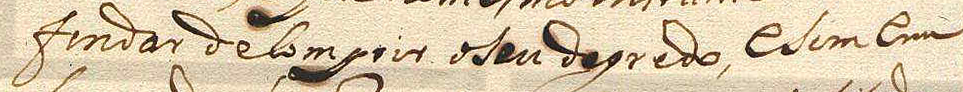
fendar de Comprir o seu degredo, e sem em
